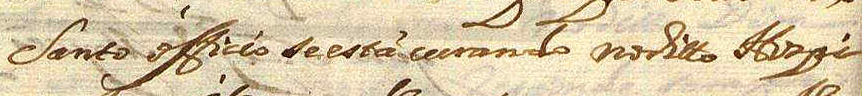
Santo officio se está curando no ditto Hospi
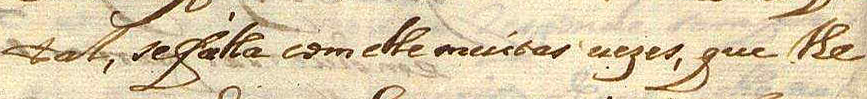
tal, se falla com elle muitas uezes, que lhe
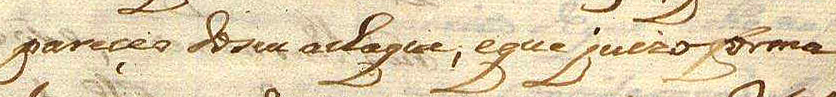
pareceo do seu achaque, e que juizo forma
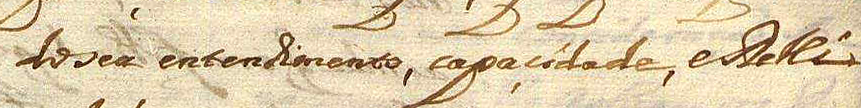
do seu entendimento, capacidade, e Relli
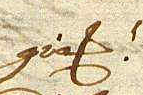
giaõ?
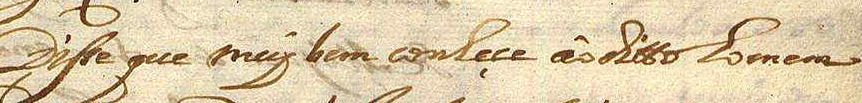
Disse que muy bem conhece ao ditto homem
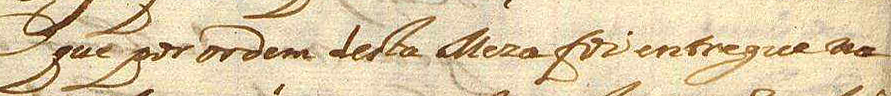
que por ordem desta Meza foi entregue na
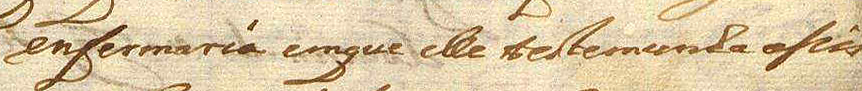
enfermaria em que elle testemunha assis
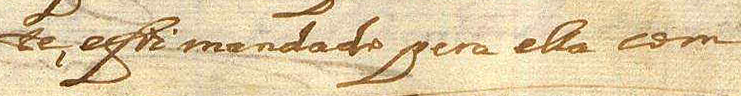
te, e foi mandado pera ella com
